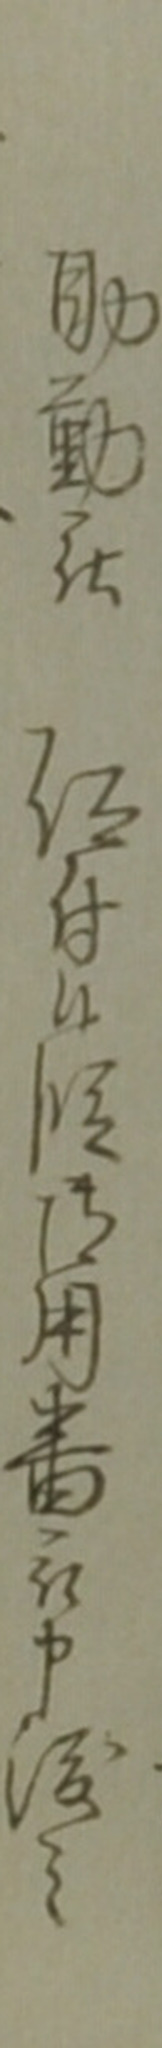助勤被仰付候段御用番被申渡之
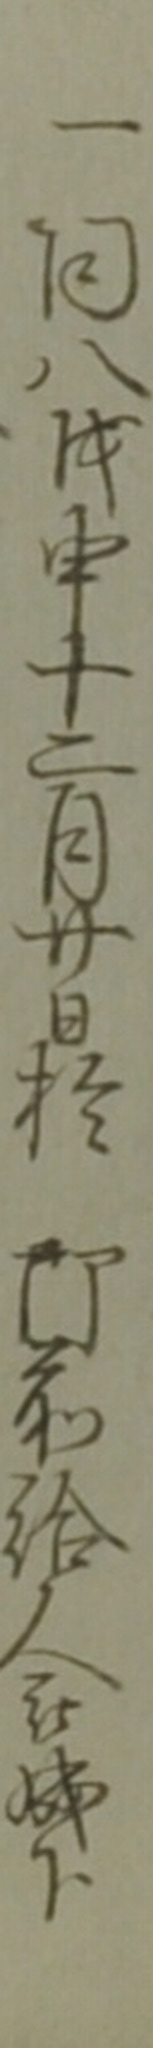一同八戊申十二月廿日於御前給人被成下
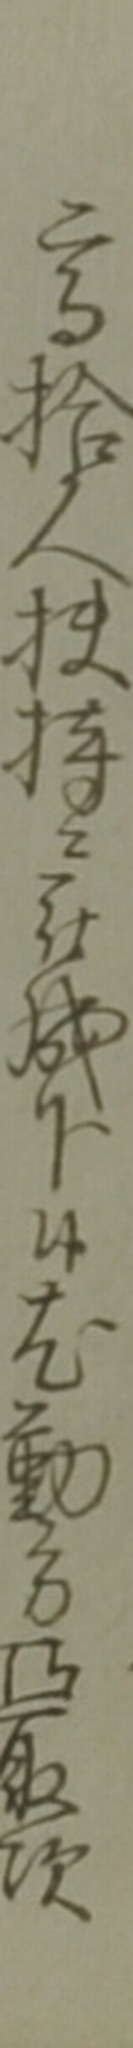高拾人扶持ニ被成下候尤勤方御取次
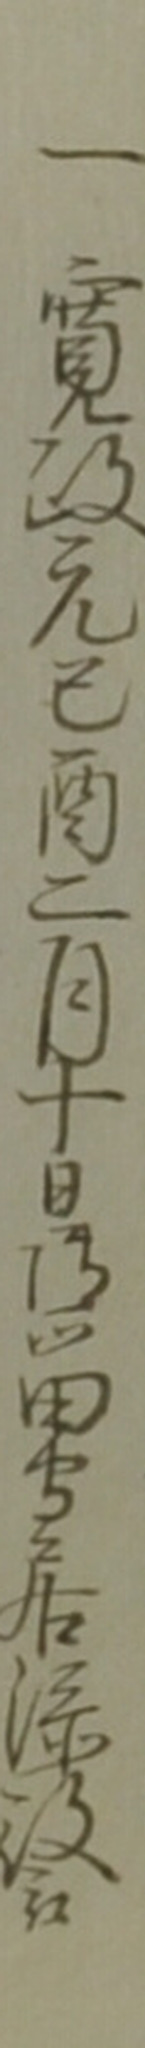一寛政元己酉二月十日御留守居添役被
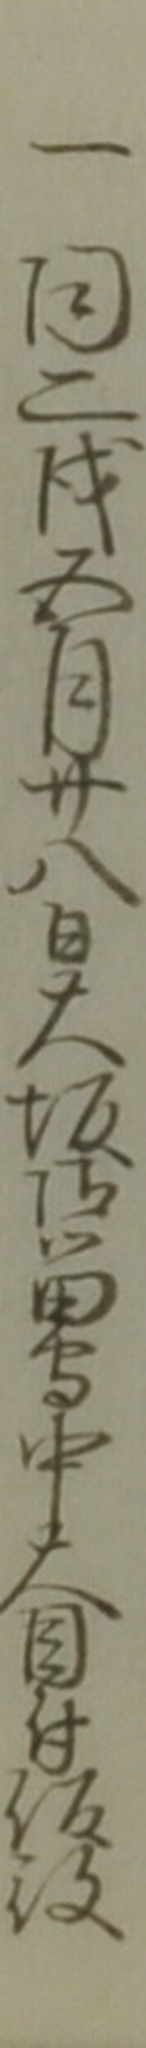一同二戌五月廿八日大坂御留守中大目付仮役
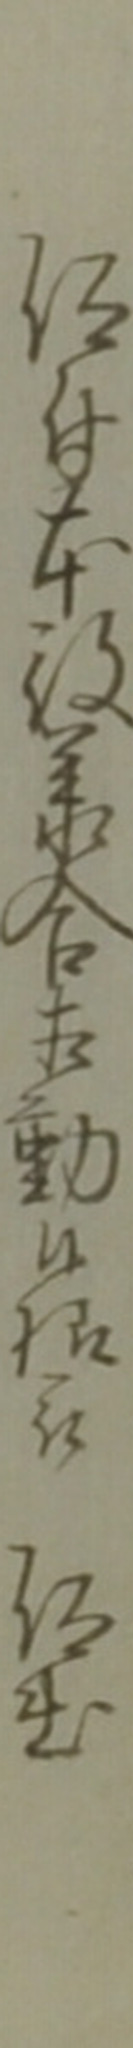仰付本役承合相勤候様被仰出
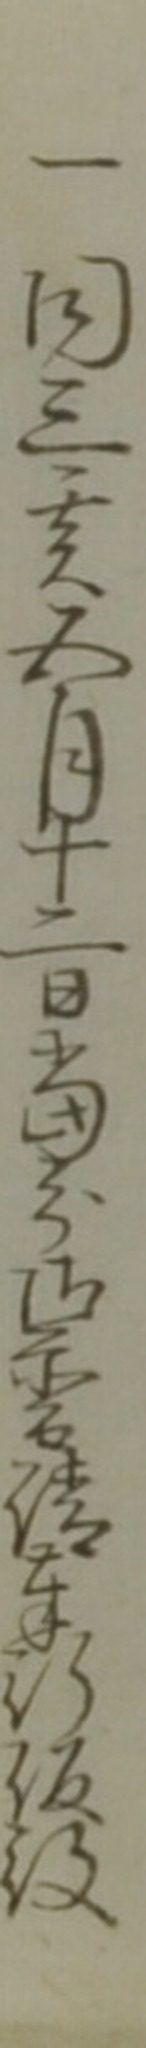一同三亥五月十二日当分御普請奉行仮役
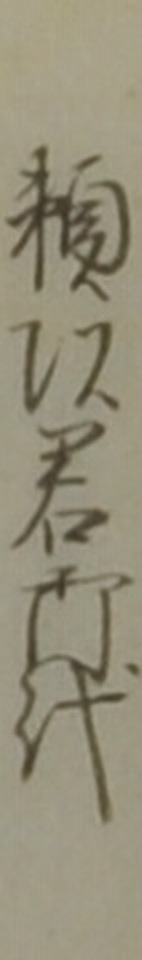頼以君御代
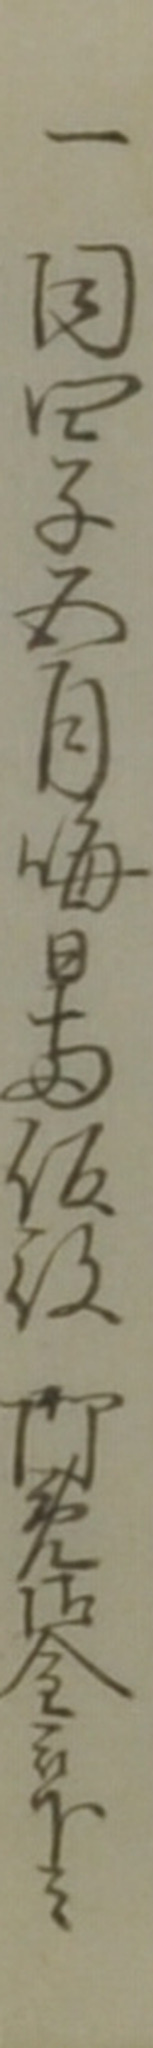一同四子五月晦日両仮役御免御金被下之
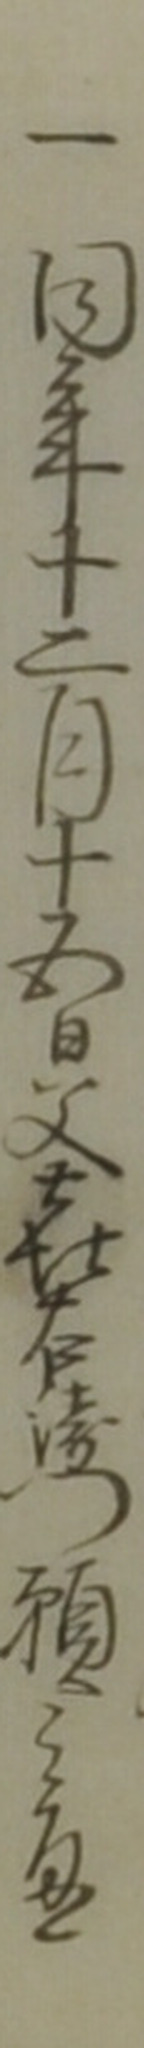一同年十二月十五日父喜右衛門願之通
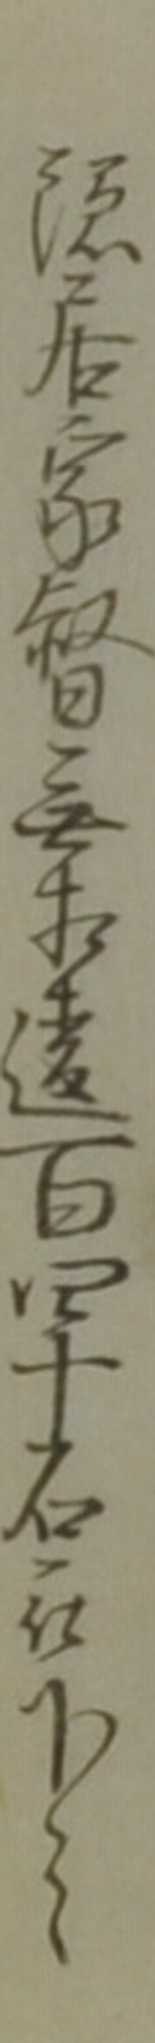隠居家督無相違百四十石被下之
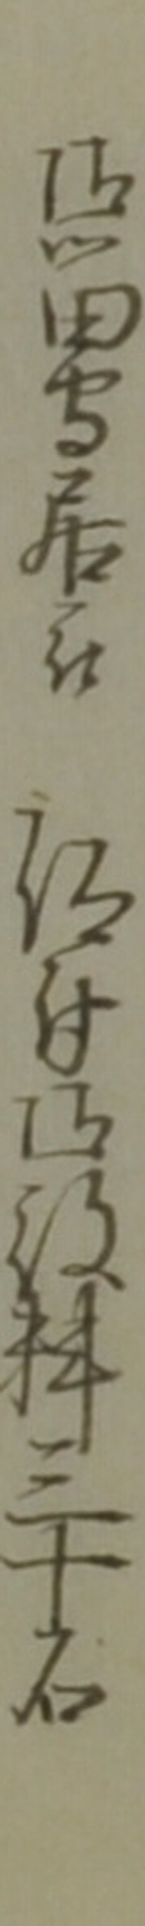御留守居被仰付御役料三十石
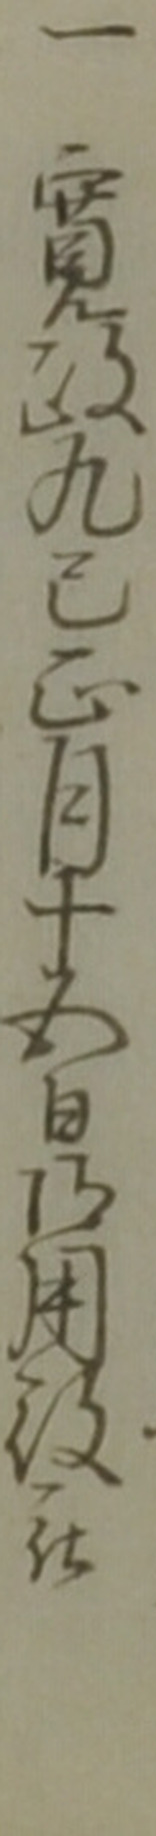一寛政九巳正月十五日御用役被
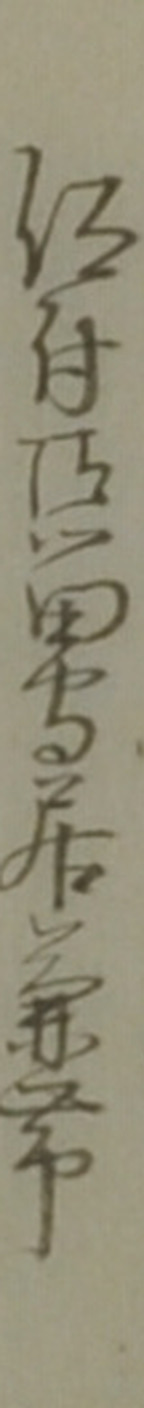仰付御留守居兼帯
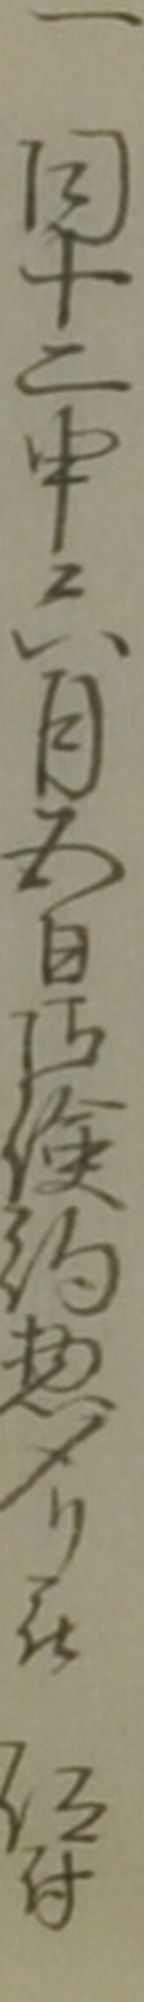一同十二申六月五日御倹約惣〆り被仰付
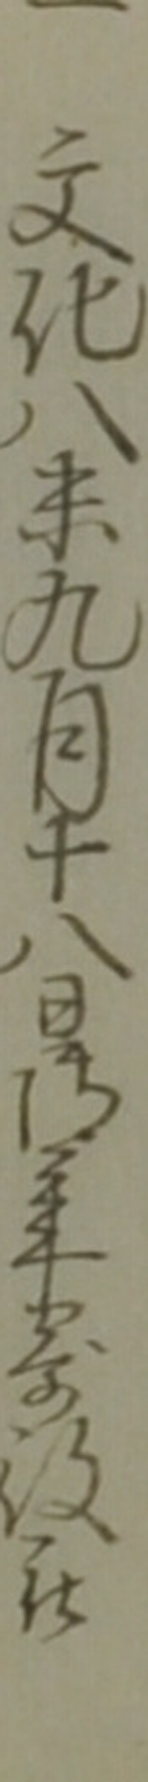一文化八未九月十八日御年寄役被
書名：給人諸士勤仕録（三）
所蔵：伊那市立高遠町図書館・合同会社AMANE
